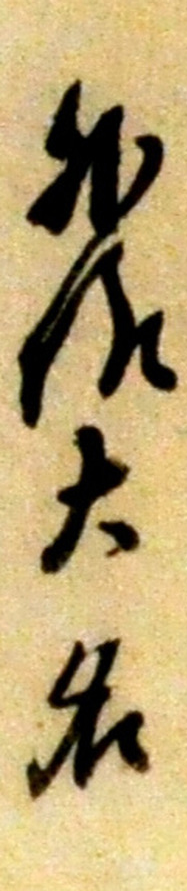外様大名
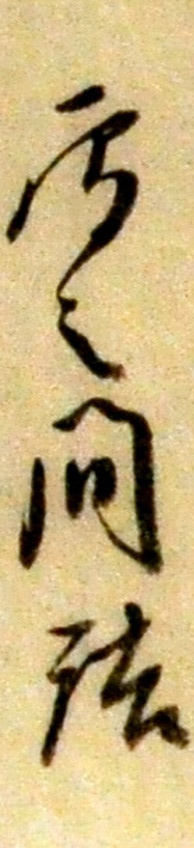鳫之間詰
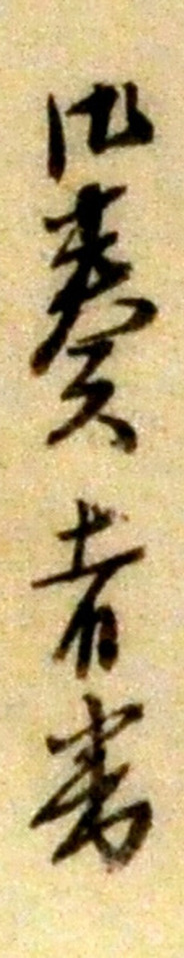御奏者番
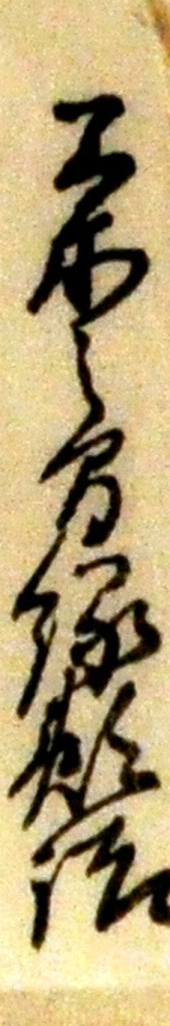菊之間縁頬詰
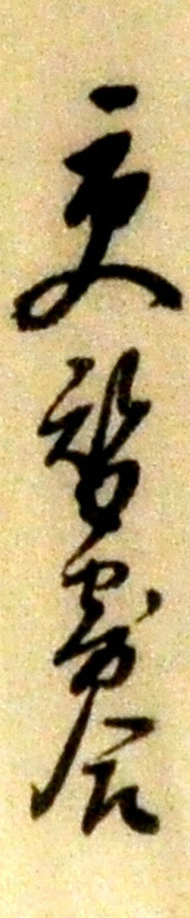交替寄合
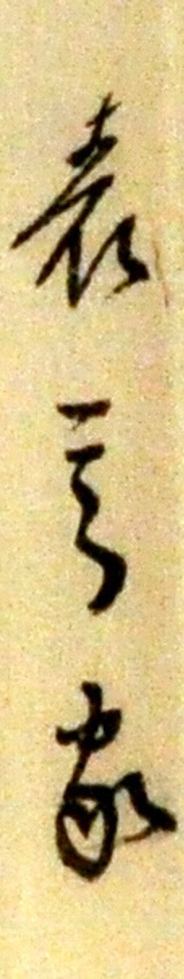表高家
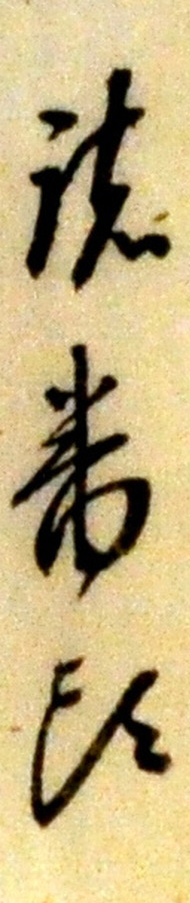諸番頭
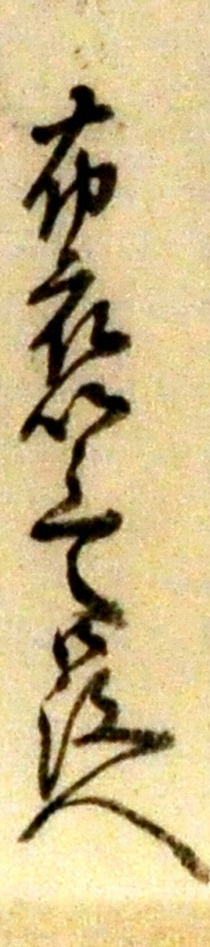布衣以上之御役人
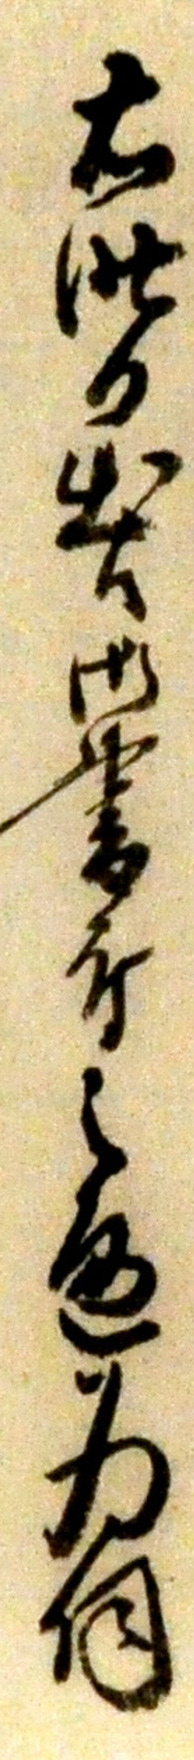右昨日出候御書付之通為伺
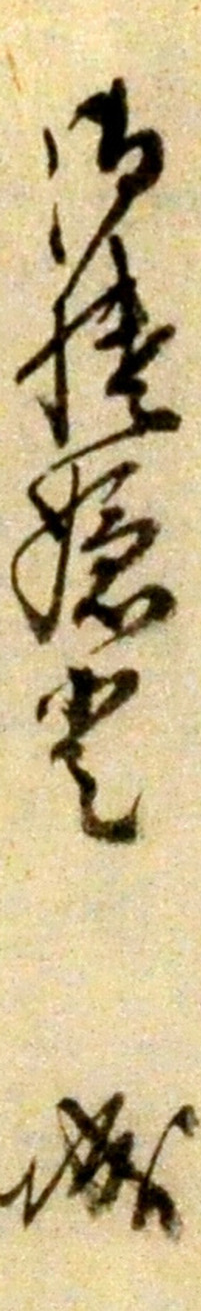御機嫌登城
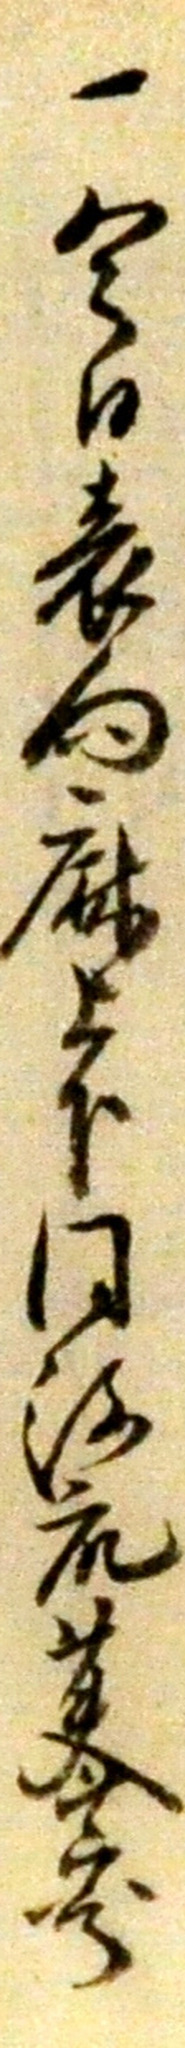一今日表向麻上下同役衆芙蓉
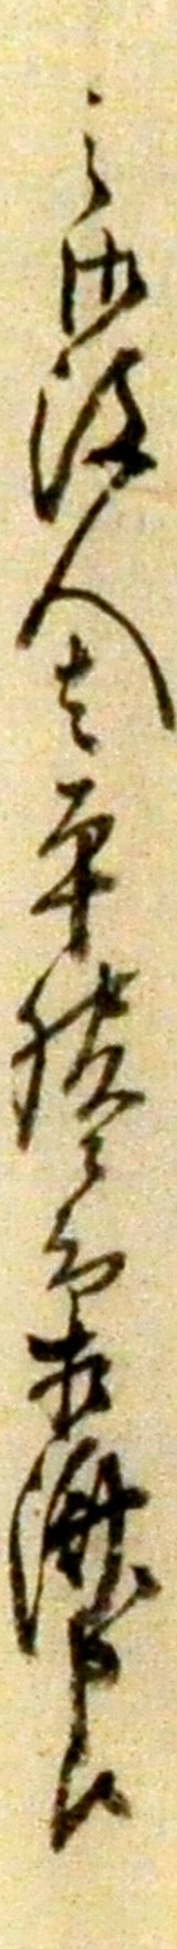之御役人者平服ニ而相済申候
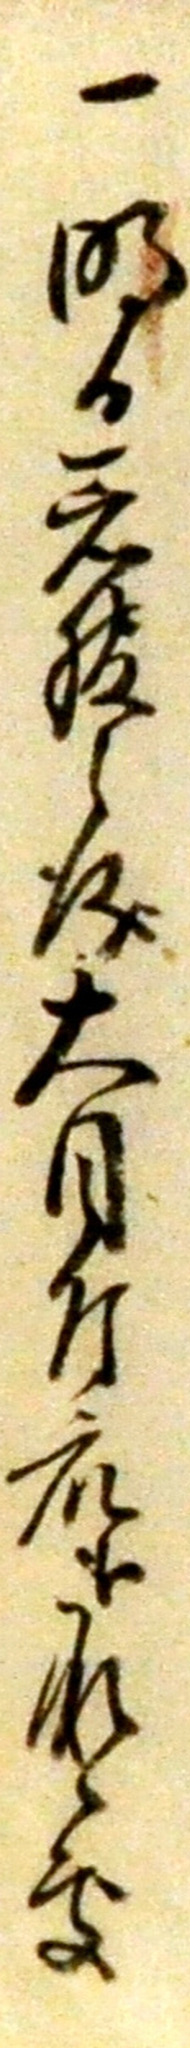一明日着服之儀大目付衆江承候処
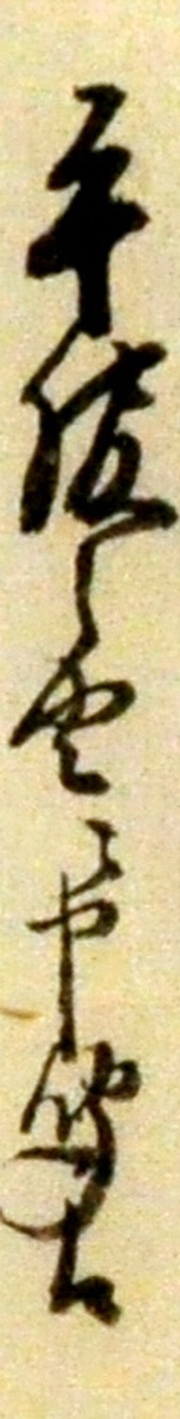平服之由ニ申聞候
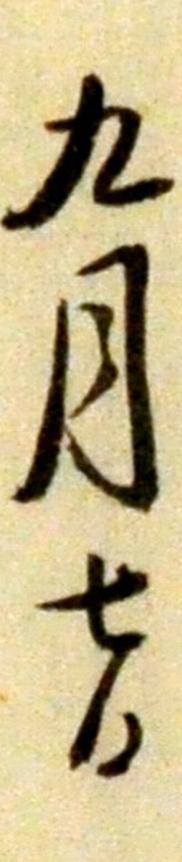九月七日
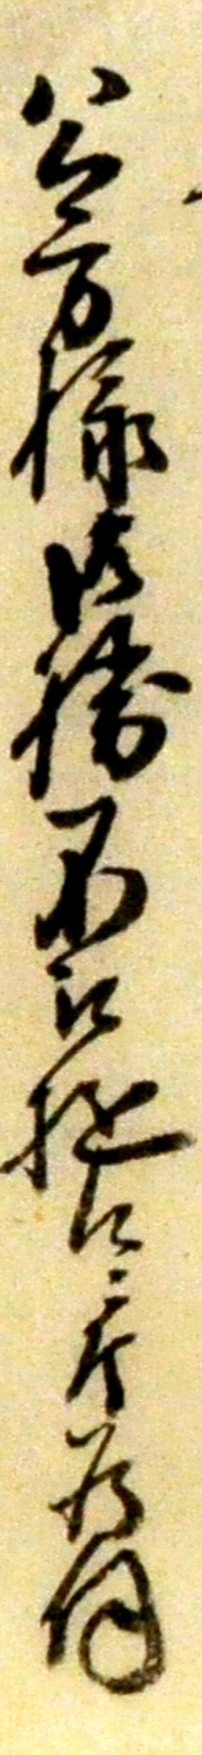公方様御勝不被遊候ニ付為伺
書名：書抜
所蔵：伊那市立高遠町図書館・合同会社AMANE
